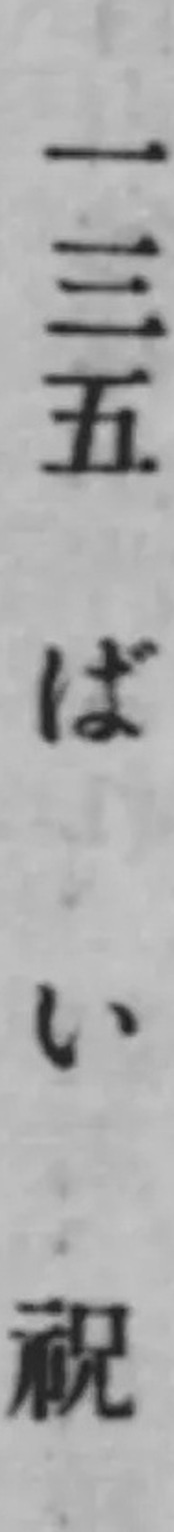一三五ばい祝
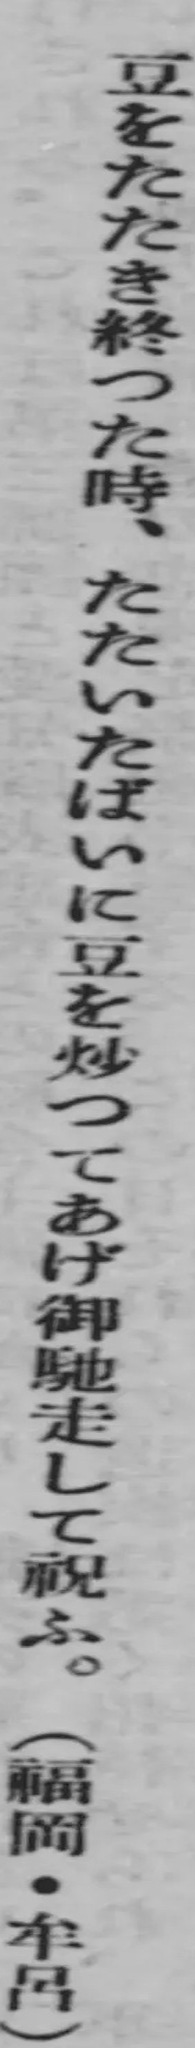豆をたたき終つた時、たたいたばいに豆を炒つてあげ御馳走して祝ふ。(福岡・牟呂)
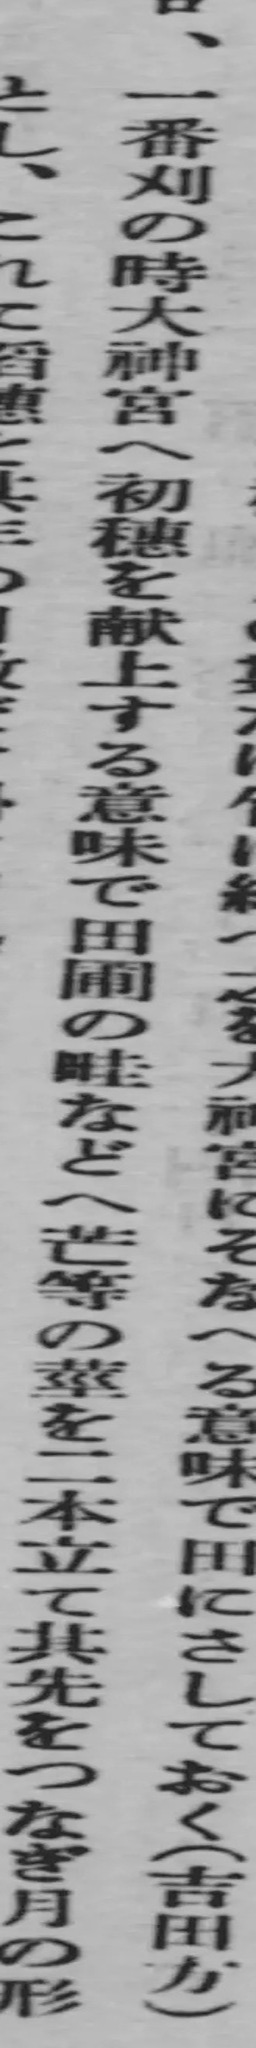ロ、一番刈の時大神宮へ初穗を献上する意味で田圃の畦などへ芒等の莖を二本立て其先をつなぎ月の形
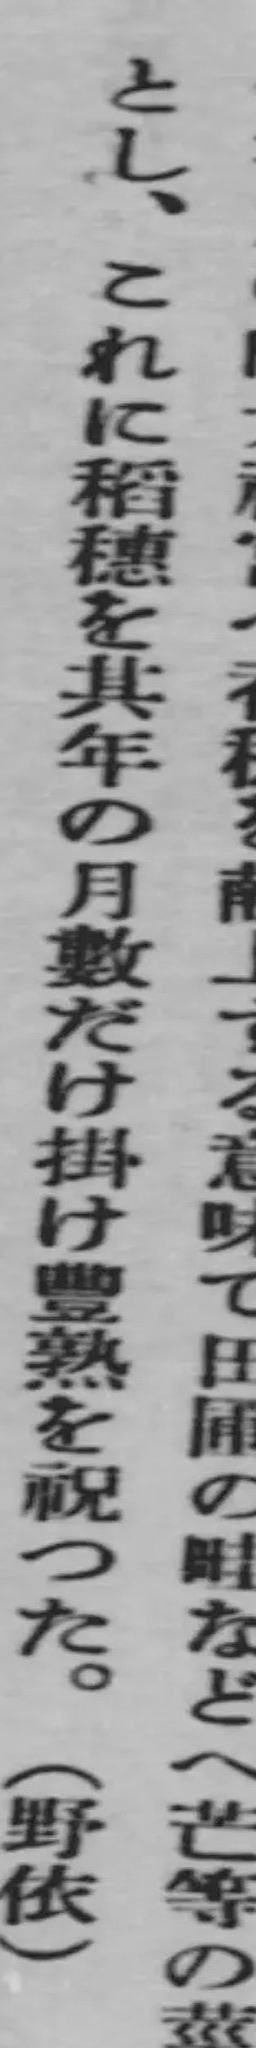とし、これに稻穗を其年の月數だけ掛け豐熟を祝つた。(野依)
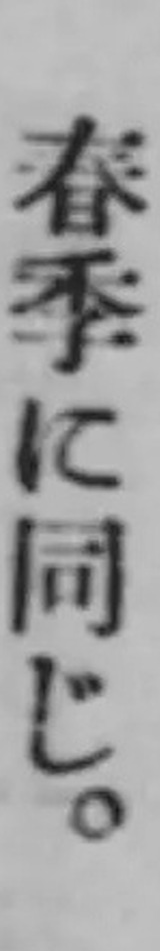春季に同じ。
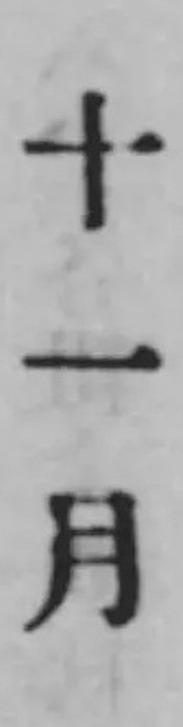十一月
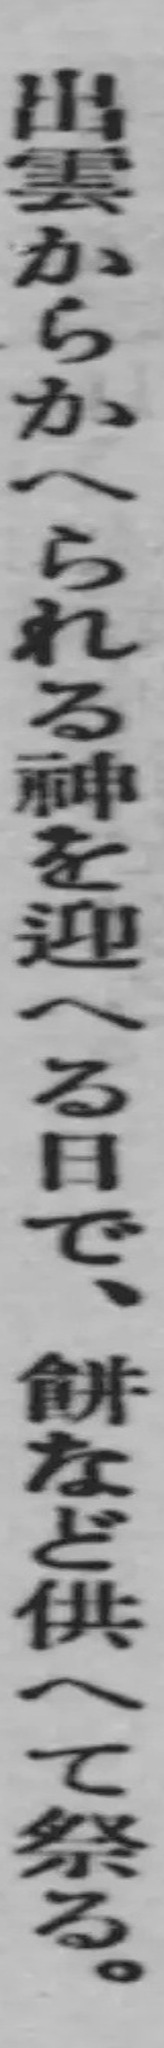出雲からかへられる神を迎へる日で、餅など供へて祭る。
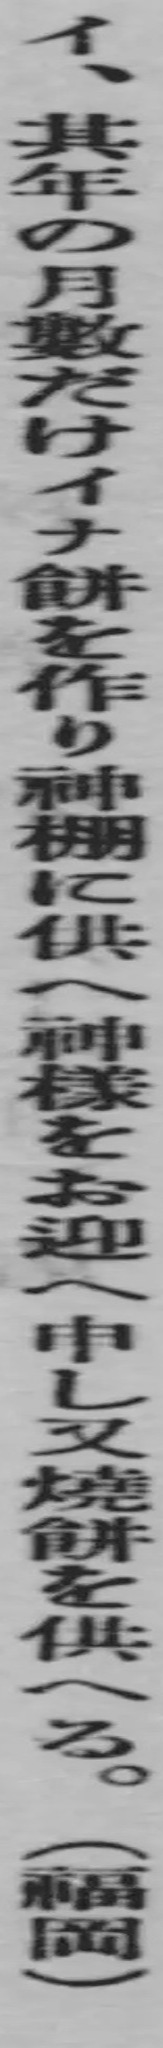イ、其年の月數だけイナ餅を作り神棚に供へ神様をお迎へ申し又燒餅を供へる。(福岡)
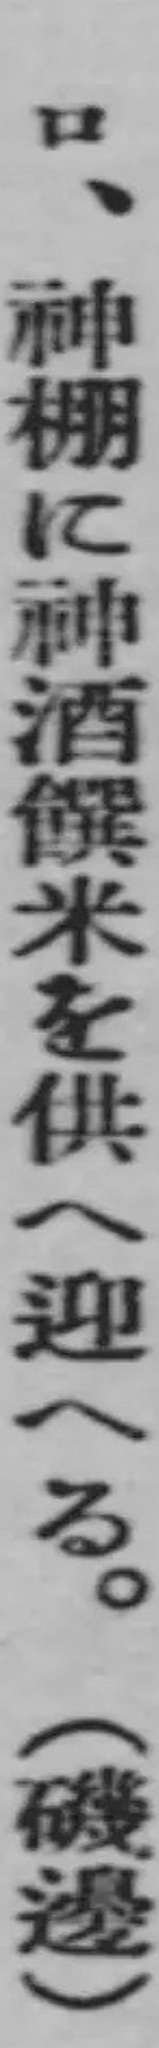ロ、神棚に神酒饌米を供へ迎へる。(磯邊)
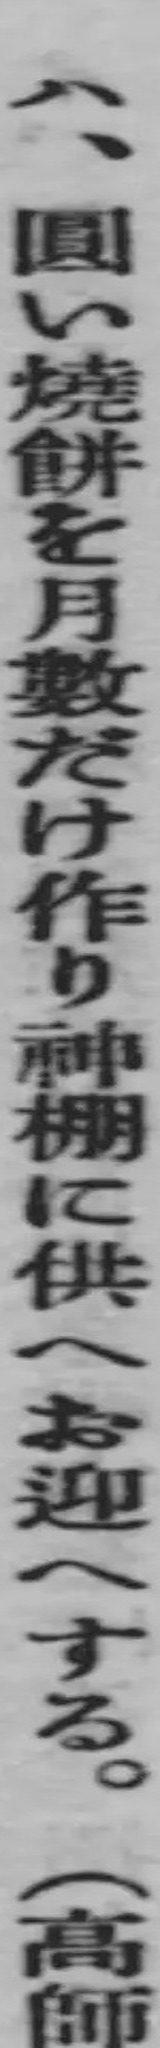ハ、圓い燒餅を月數だけ作り神棚に供へお迎へする。(高師)
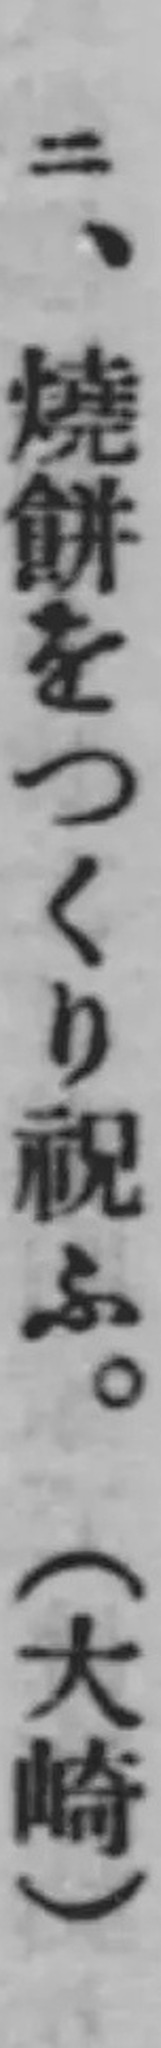ニ、燒餅をつくり祝ふ。(大崎)
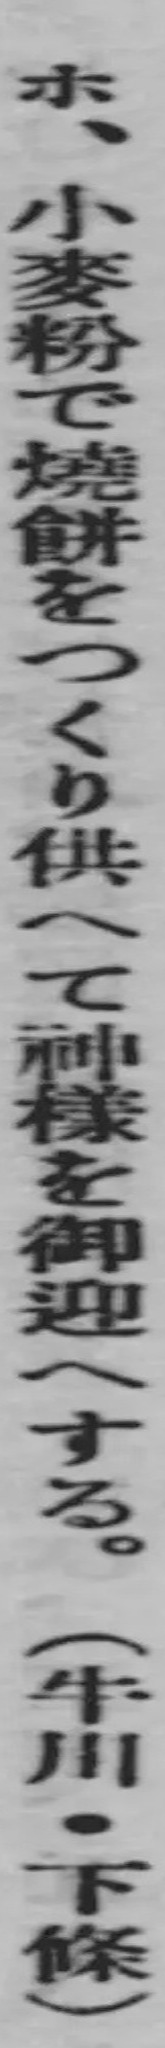ホ、小麥粉で燒餅をつくり供へて神様を御迎へする。(牛川・下條)
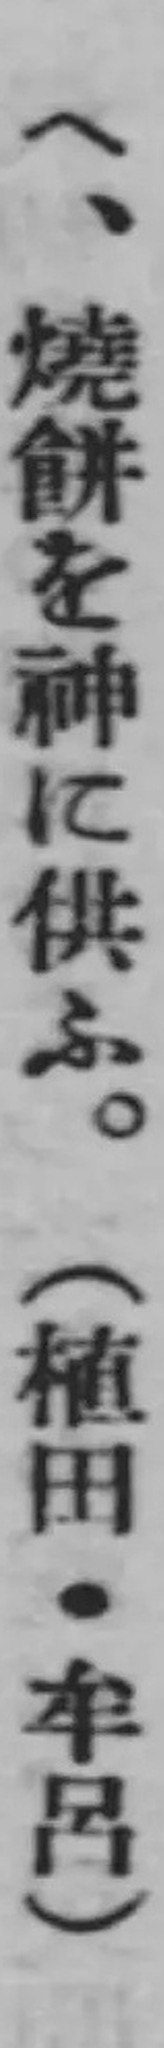へ、燒餅を神に供ふ。(植田・牟呂)
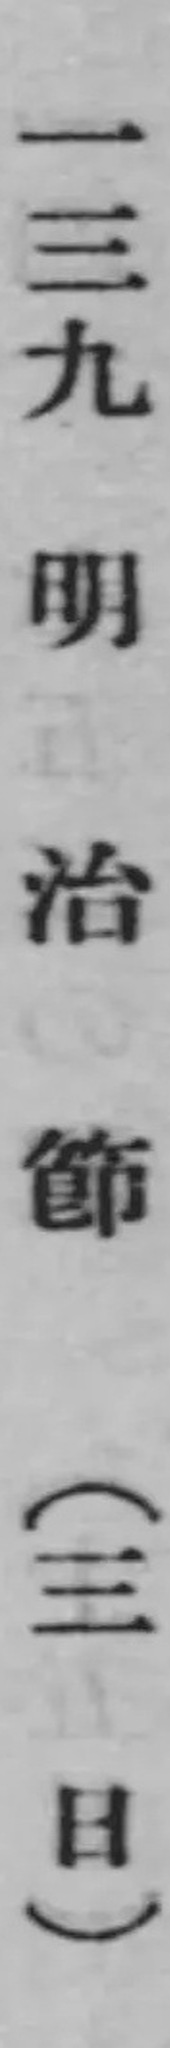一三九明治節(三日)
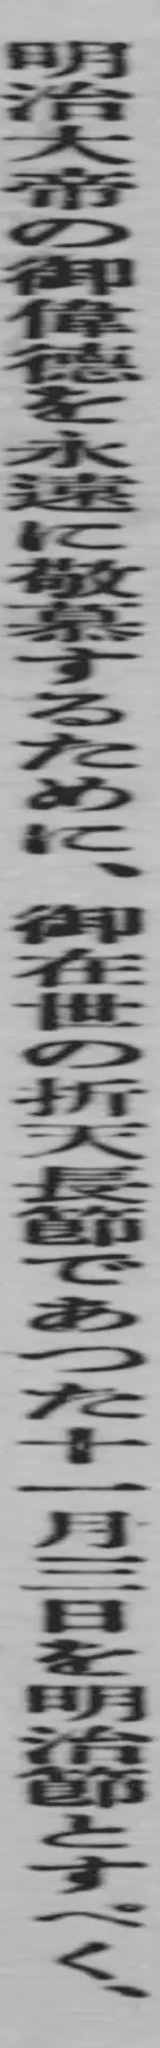明治大帝の御偉德を永遠に敬慕するために、御在世の折天長節であつた十一月三日を明治節とすべく、
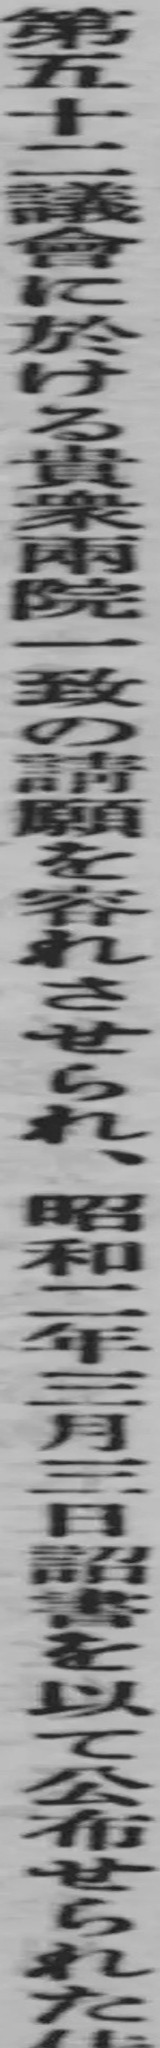第五十二議會に於ける貴衆兩院一致の請願を容れさせられ、昭和二年三月三日詔書を以て公布せられた佳
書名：豊橋の年中行事
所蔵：国立国会図書館 National Diet Library, JAPAN
